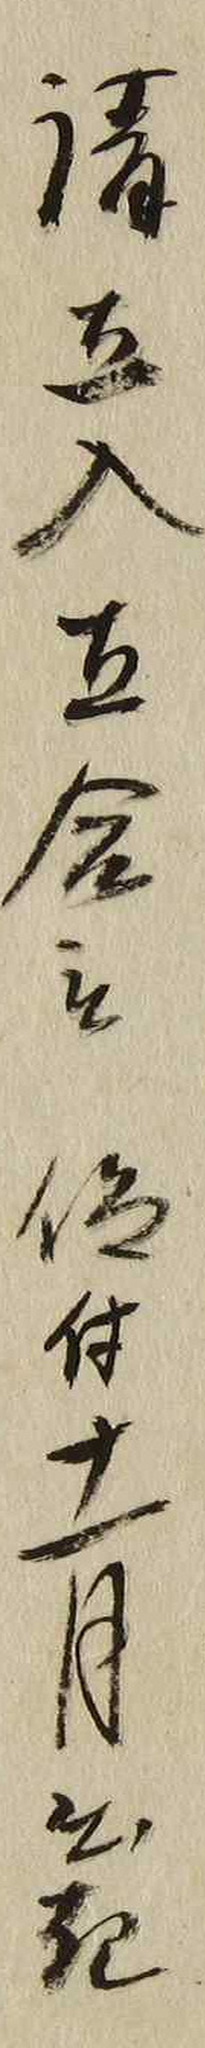請立入立合被仰付十一月出起
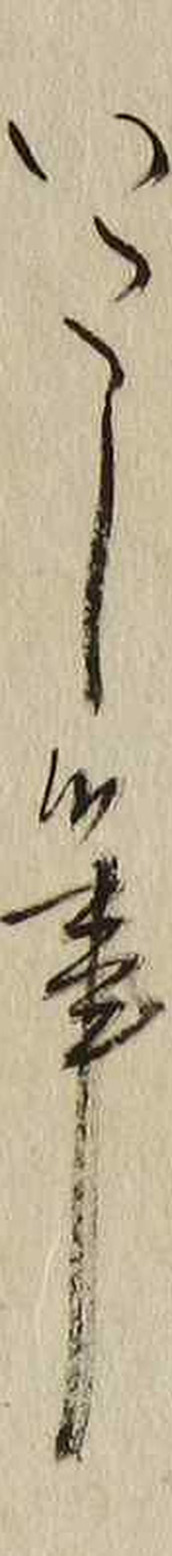いたし候事
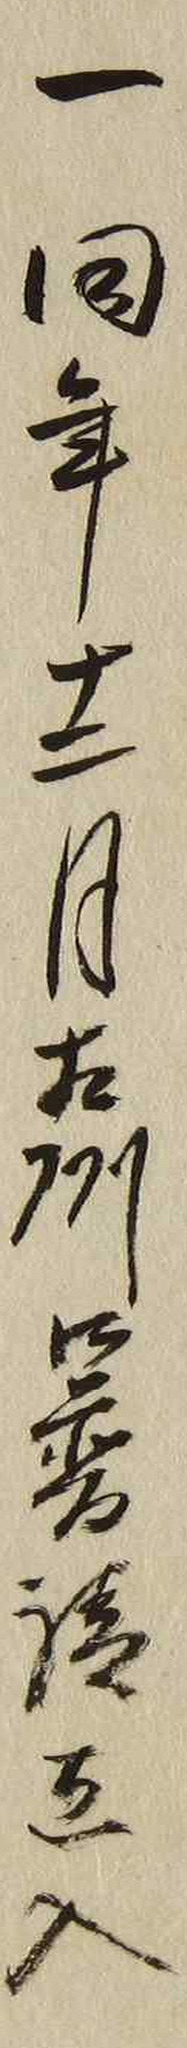一同年十二月相州御普請立入
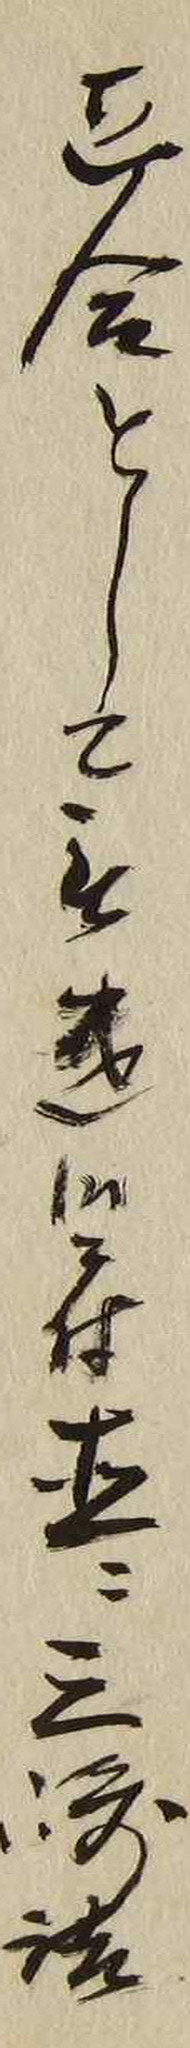立合として被遣候ニ付直ニ三崎詰
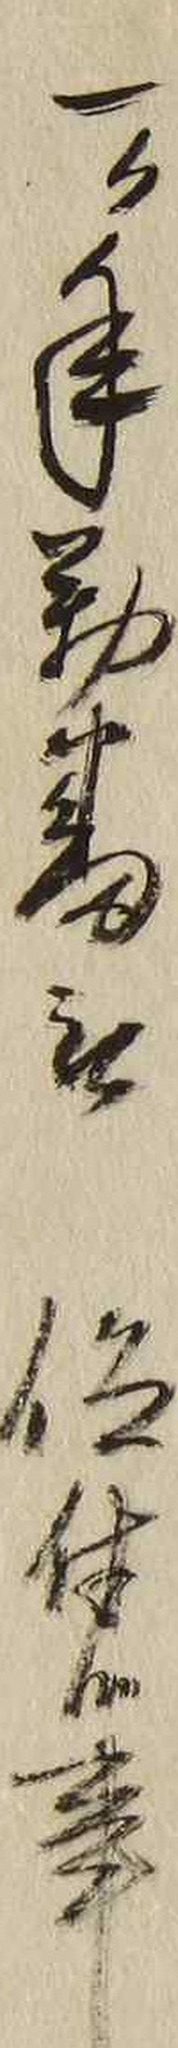一ケ年勤番被仰付候事

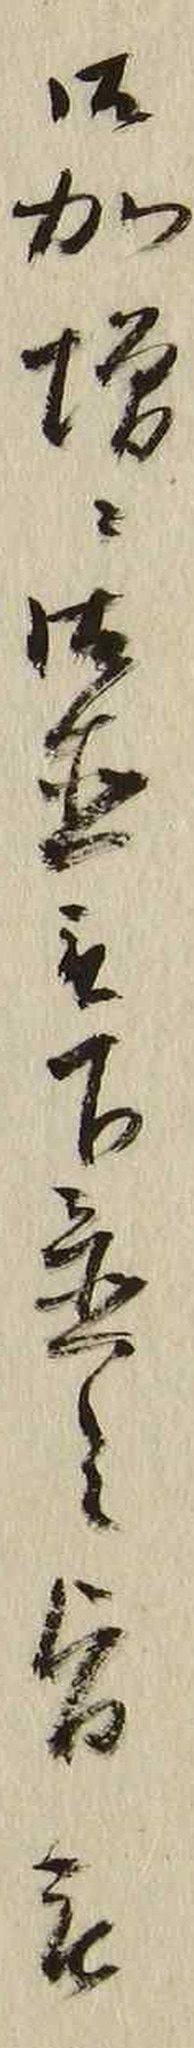御加増ニ御直被下置之旨被
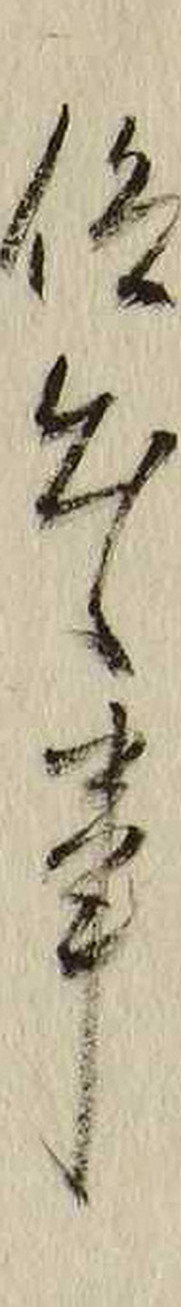仰出候事
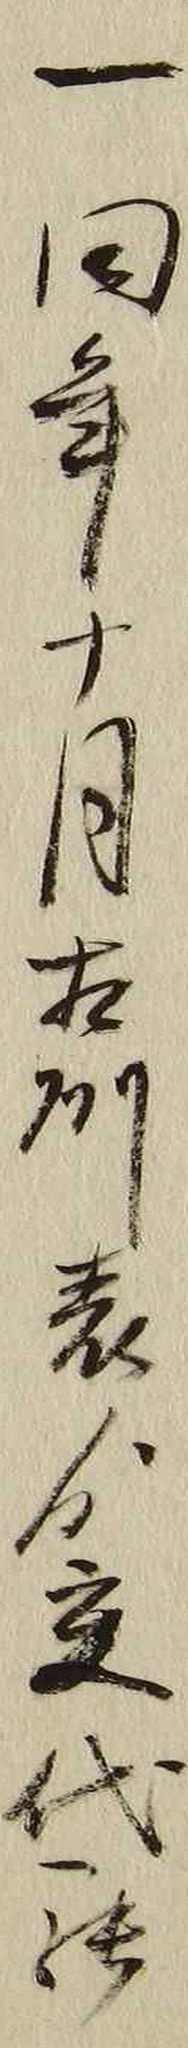一同年十月相州表ゟ交代罷
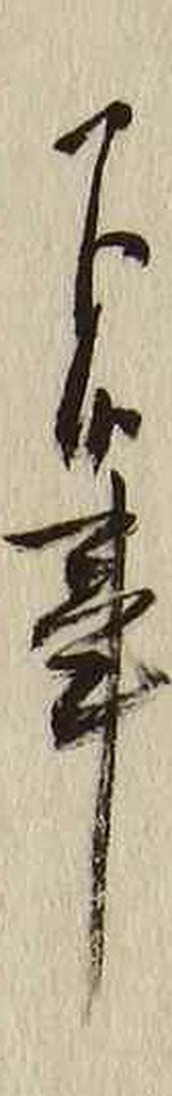下候事
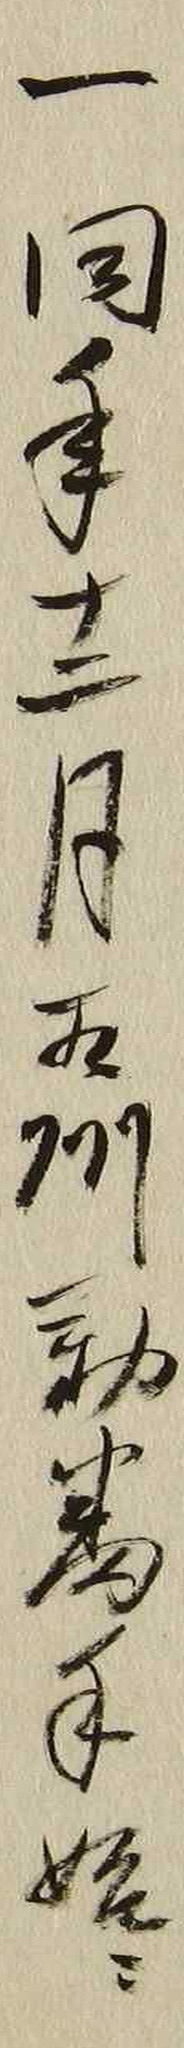一同年十二月相州勤番手始ニ
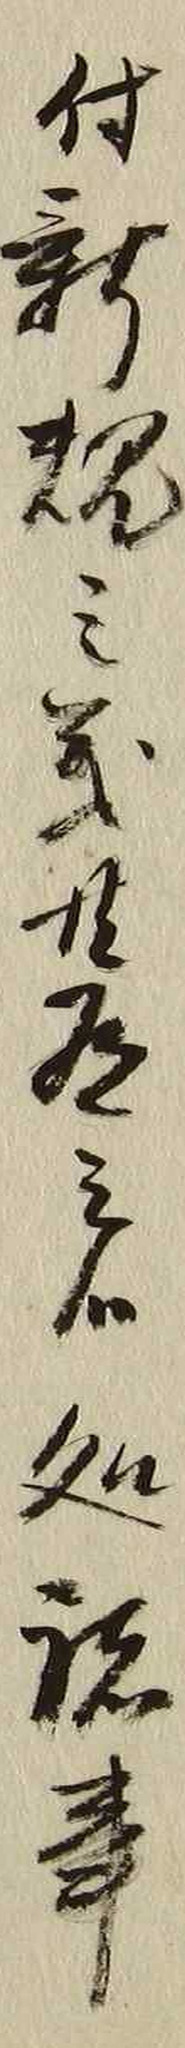付新規之義共有之候処諸事
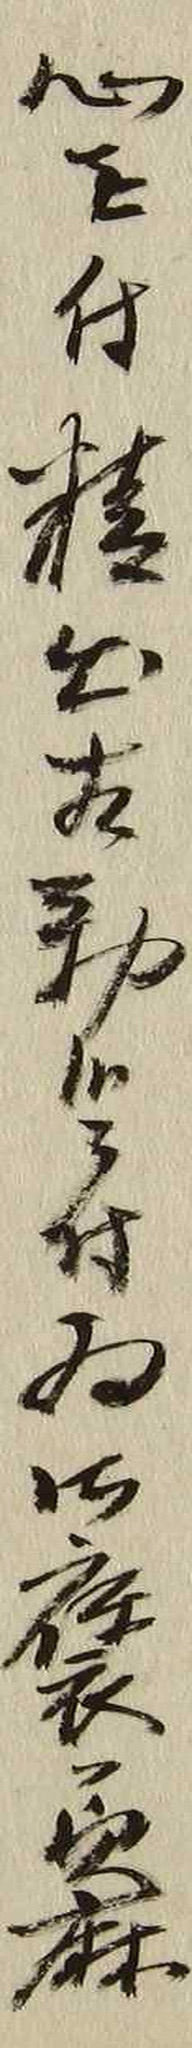心を付精出相勤候ニ付為御褒美麻
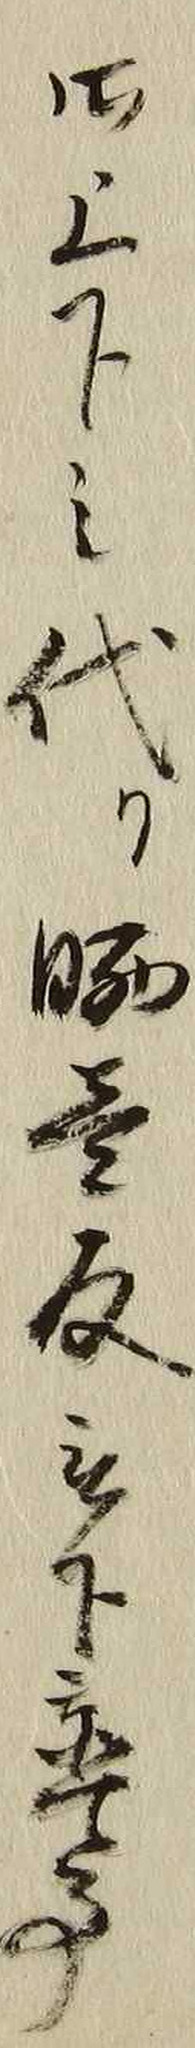御上下之代り晒壱反被下置候事
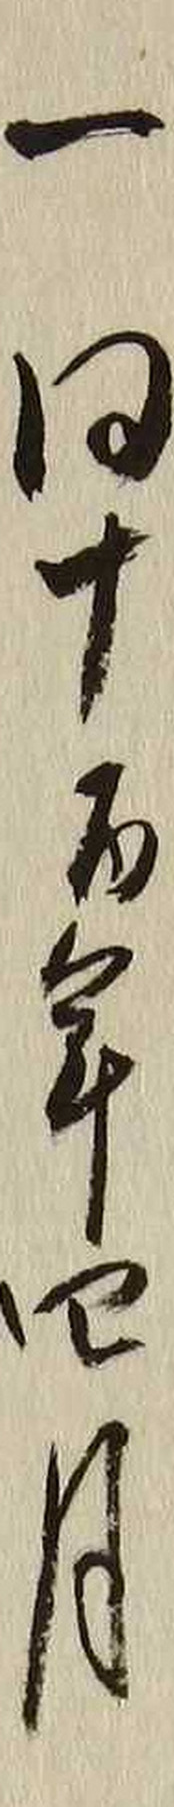一同十酉年四月
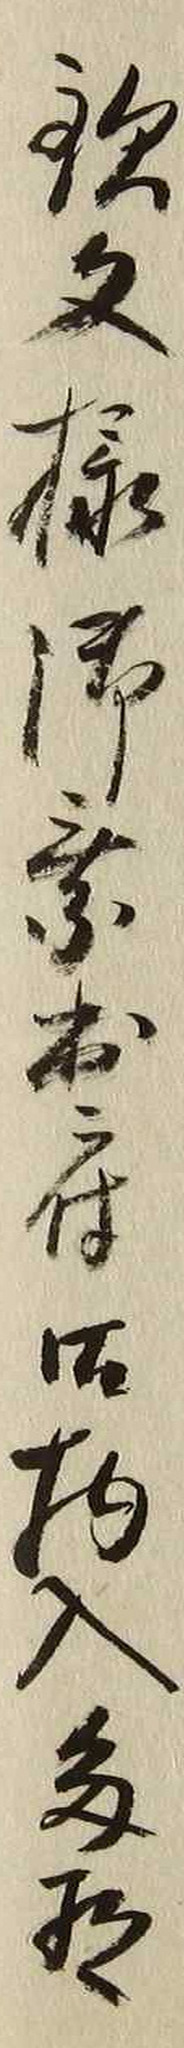欽文様御乗出ニ付御物入多有
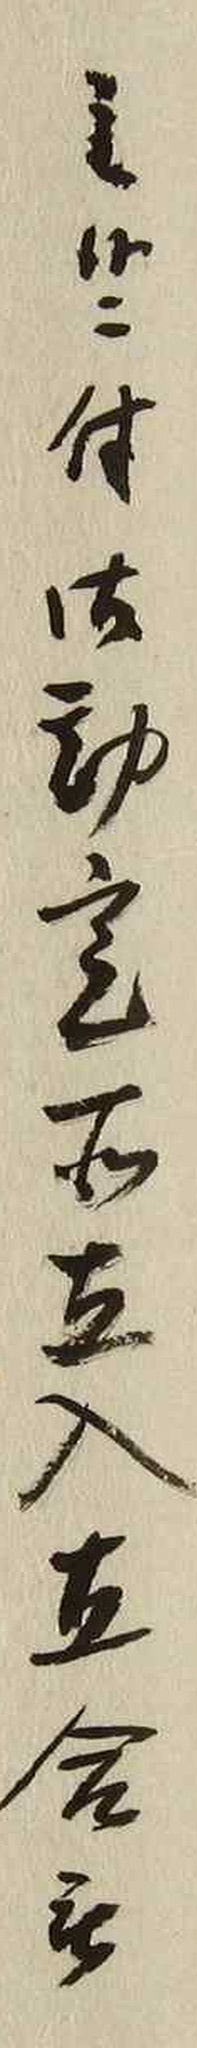之候ニ付御勘定所立入立合被
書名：諸士系譜　巻之346　も之部2
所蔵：会津若松市立会津図書館
